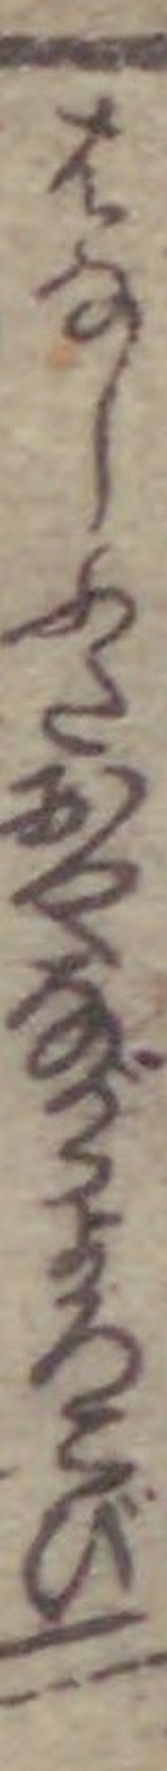はなしふたおやながらよろこび
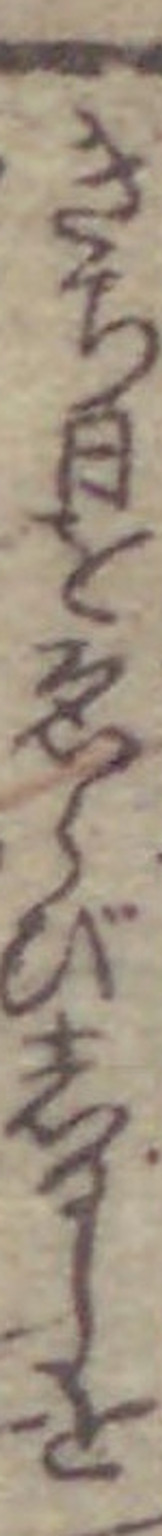きち日をゑらびしるしを
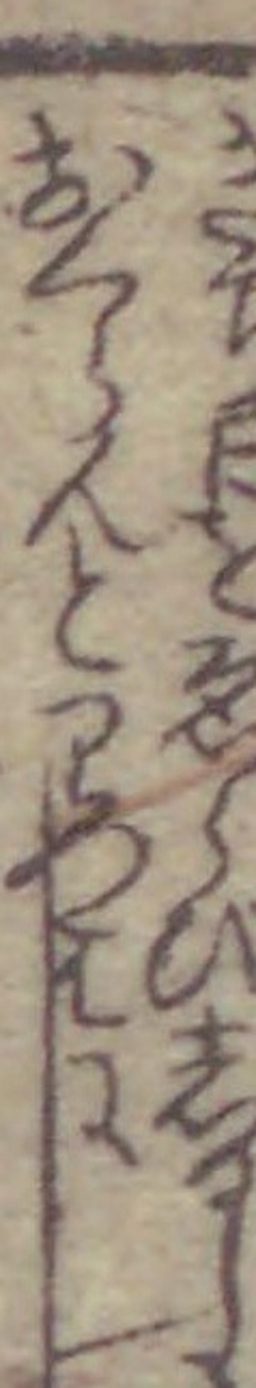おくらんとりつはに
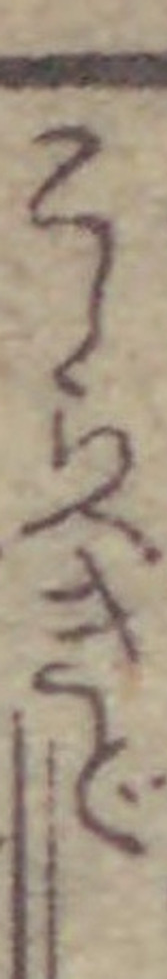こしらへきど
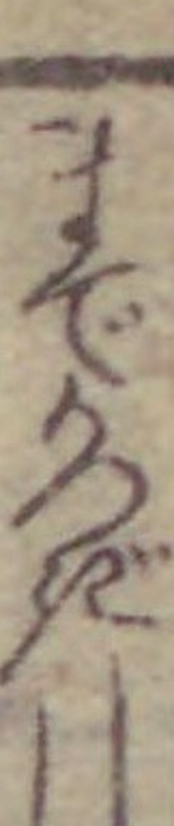までかつぎ
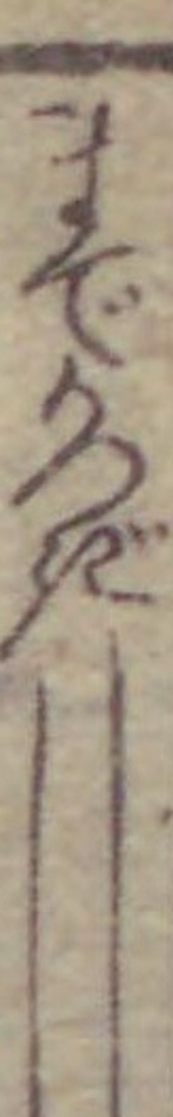までかつぎ
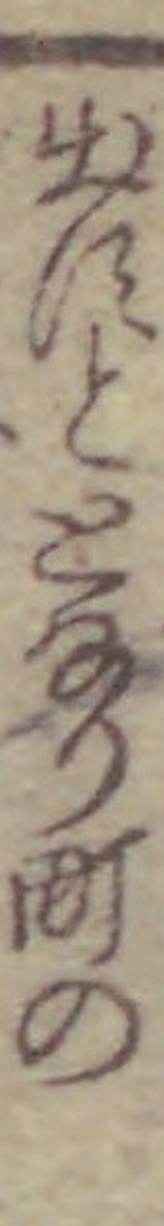出すとなり町の
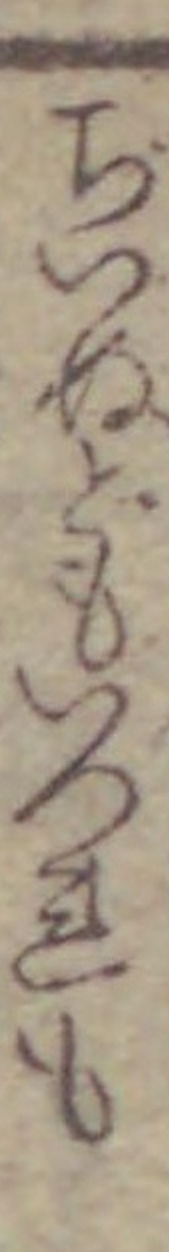ぢいぬどもいつれも
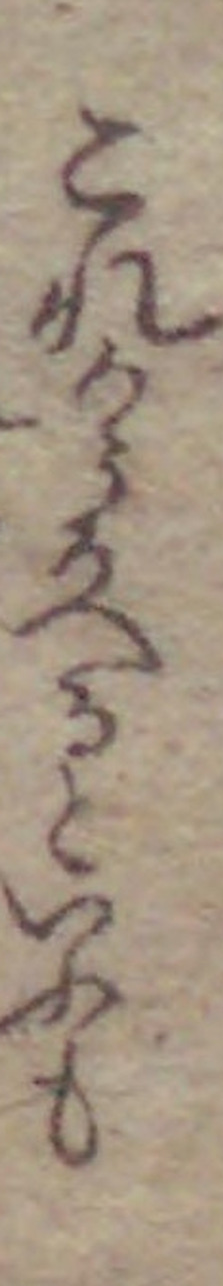これからかへるといふも
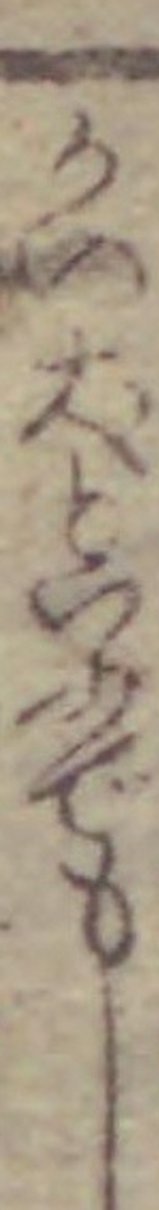かい犬といふでも
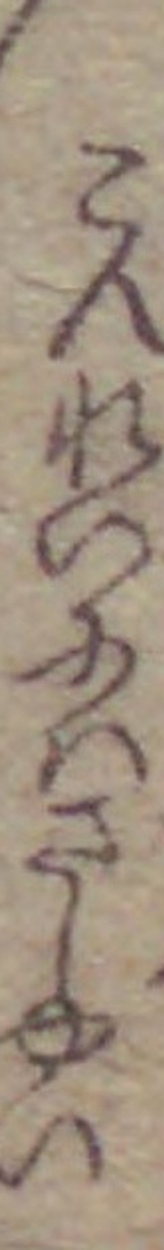こんれいにはさしやい
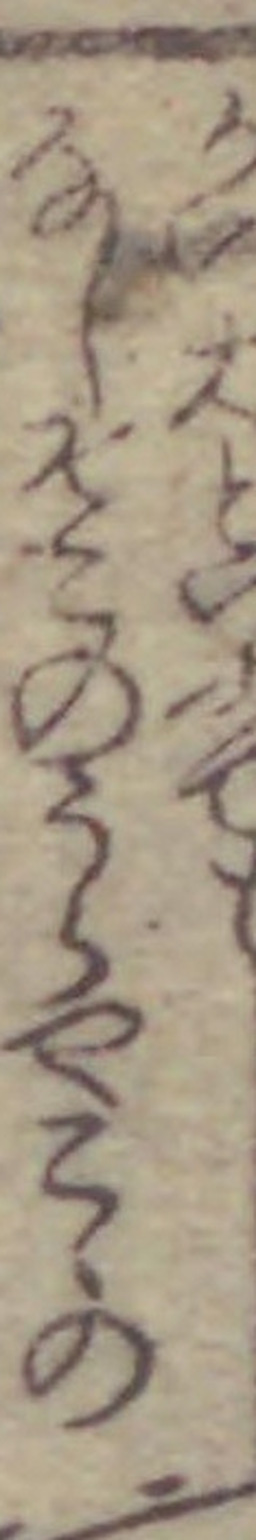なしそこのうらやこゝの
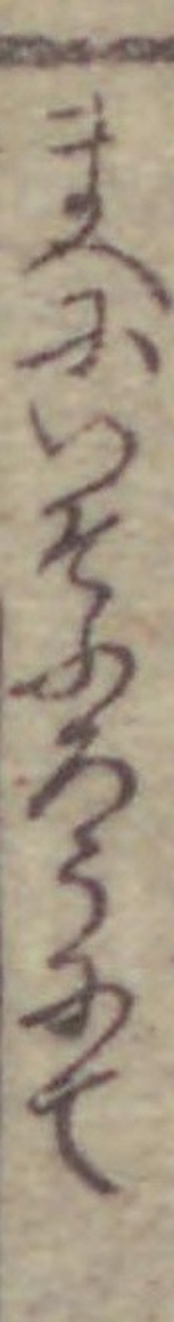まへにいそふろうにて
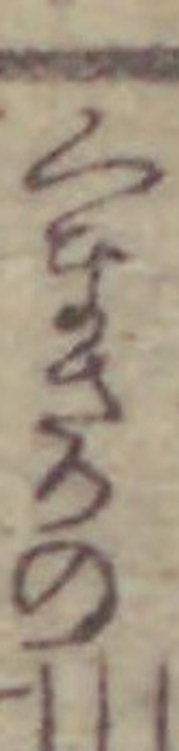くまさかの
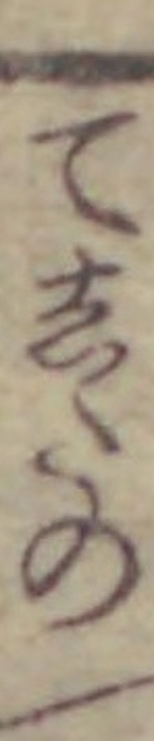てしたの
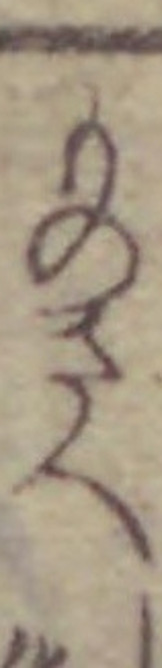ものさへ
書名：狆の嫁入 2巻
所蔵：国立国会図書館 National Diet Library, JAPAN
